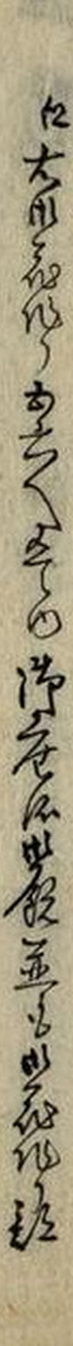但右御花作り五六人有之内御座所御厩並にも御花作り部
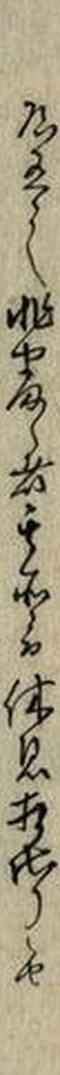屋有之非番之者其所に而休息相仕り候由
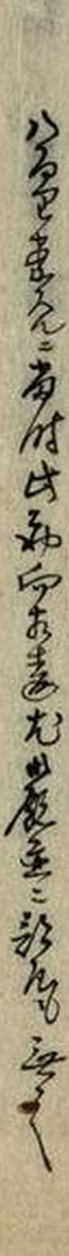八百里案するに当時此勤向相違尤御厩並に部屋も無之

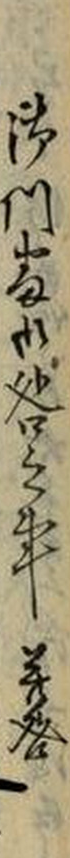御門番御咎之事并咎
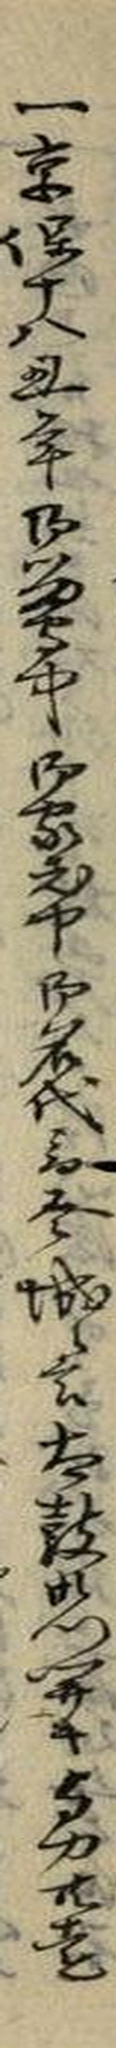一享保十八丑年御留守中御家老中御名代ニ而登城之節太鼓御門開キ与力共遠
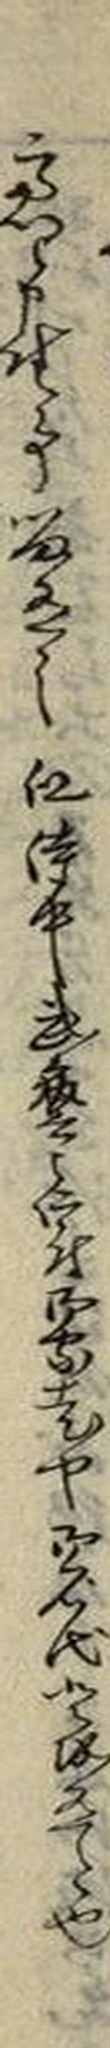慮被申付候事留有之但侍中武芸被仰付御家老中御名代登城有之也
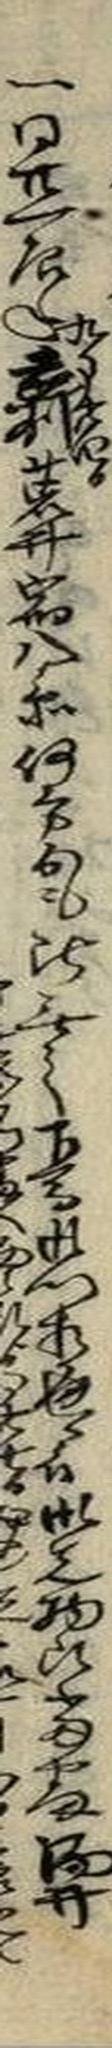一同廿一辰年九月廿四日遠州荒井宿八兵衛何方ゟも断無之下馬御門相通候ニ付御先物頭当番酒井
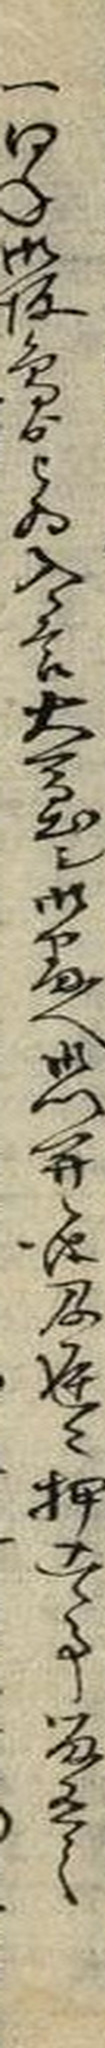一同年御坂鳥ゟ被為入候節大馬出シ御番人御門開候儀及遅々押込候事留有之
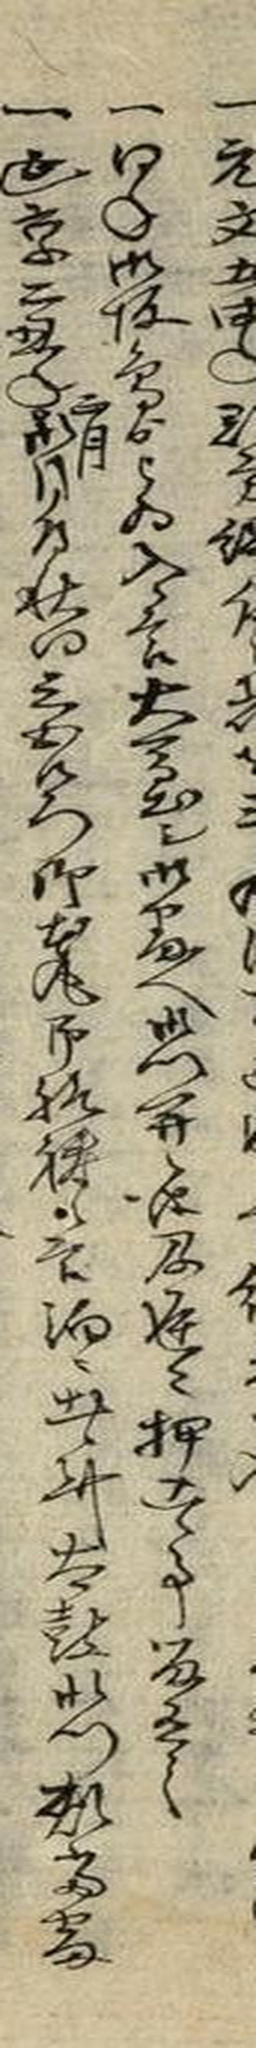一延享二丑年正月御目付秋田三五左衛門御本丸御祈祷之節泊ニ出候刻太鼓御門頬当番
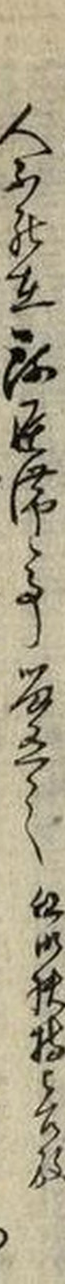人不罷在致遅滞候事留有之但御扶持被召放
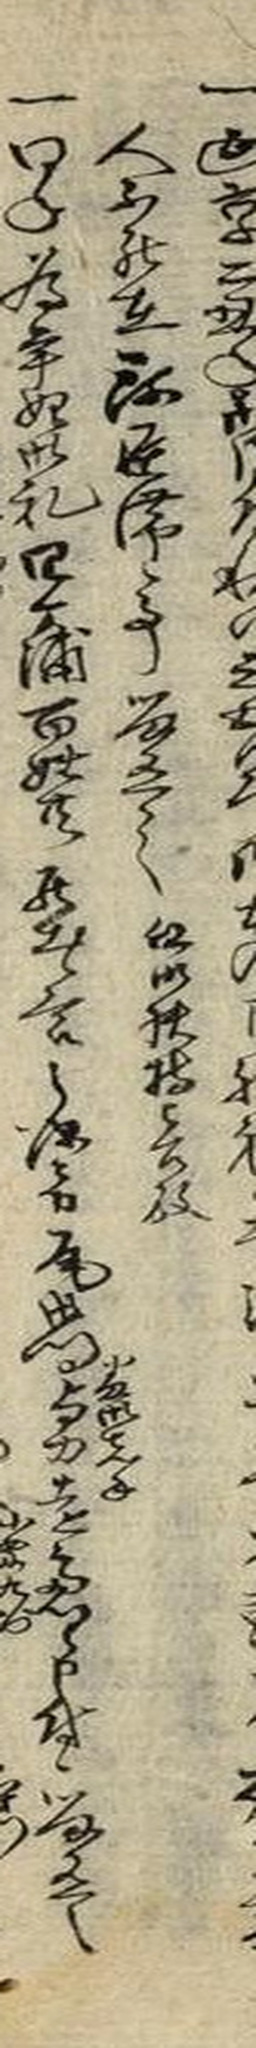一同年為年始御礼四ケ浦百姓共罷出候節之儀ニ付瓦御門番御先手○与力遠慮被申付候留有之
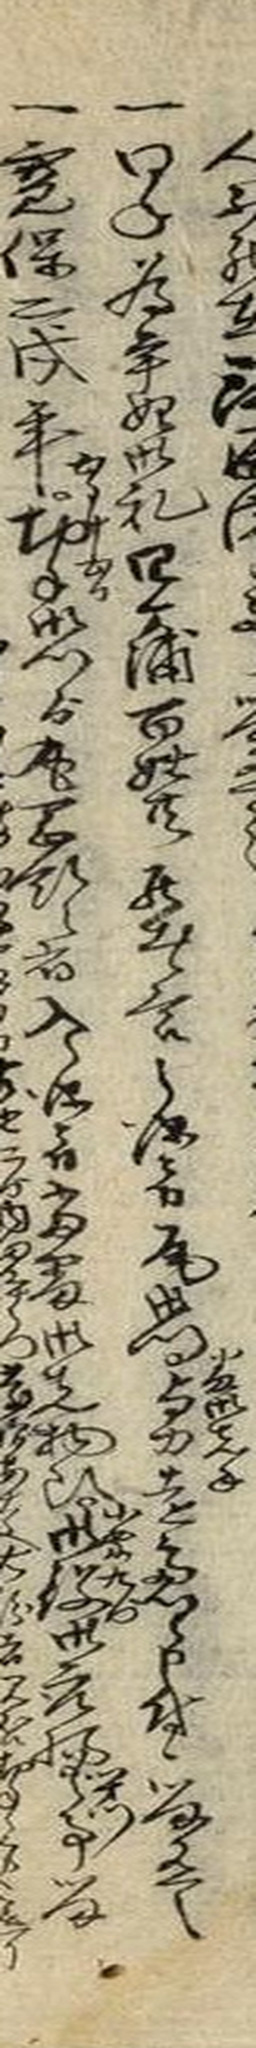一寛保二戌年五月廿五日○切手御門ゟ丸岡領之者入候儀ニ付当番御先物頭小栗九右衛門○御役御取揚閉門○候事留
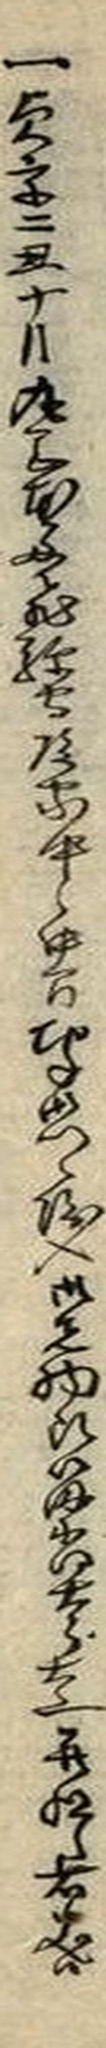一貞享二丑十年丸岡本多飛騨守殿家中之中間切手御門へ紛入御先物頭簗田太郎太夫并組之者御咎
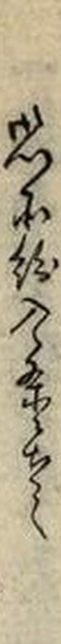御門所紛入候条ニ出之
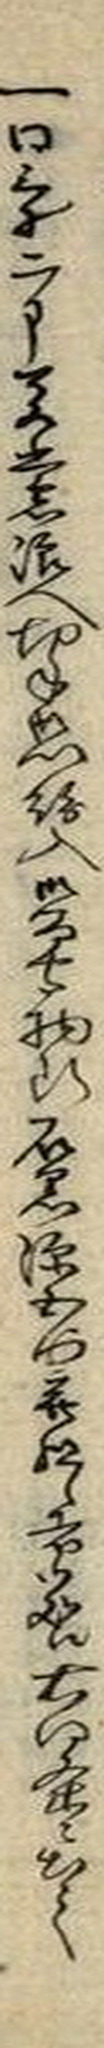一同三寅二月若党浪人切手御門紛入御留守物頭石黒源五右衛門并組之者御咎候右同条ニ出之
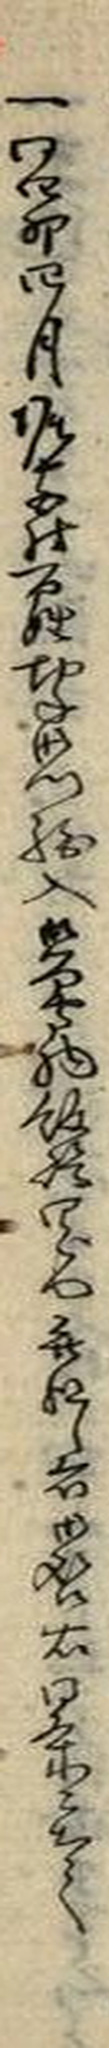一同四卯四年堀宮村百姓切手御門紛入御留守物頭飯嶋四郎右衛門并組之者御咎右同条ニ出之
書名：御門御櫓之部
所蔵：福井県文書館 Fukui Prefectural Archives
